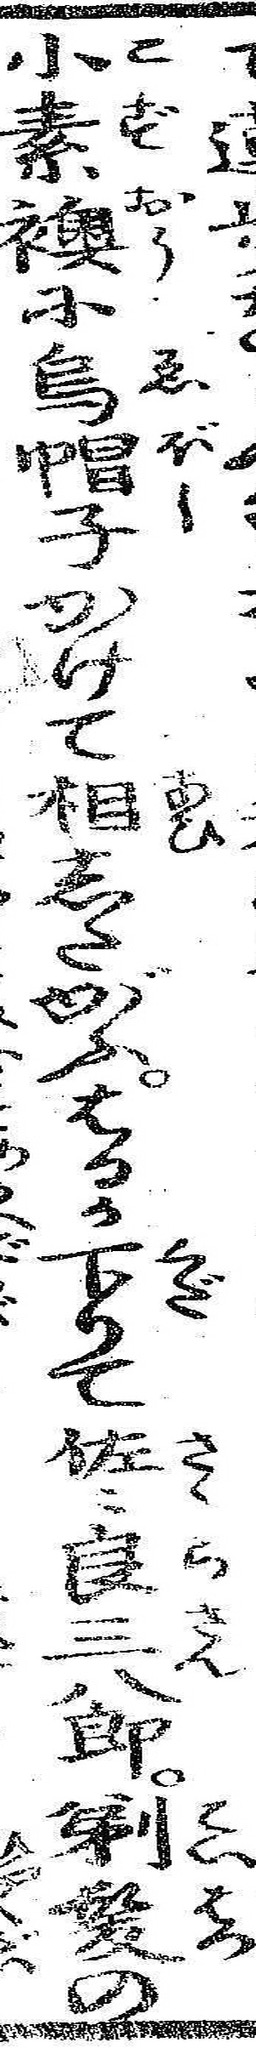小素襖に烏帽子かけて相したがふ。はるか下りて佐々良三八郎。剃髪の
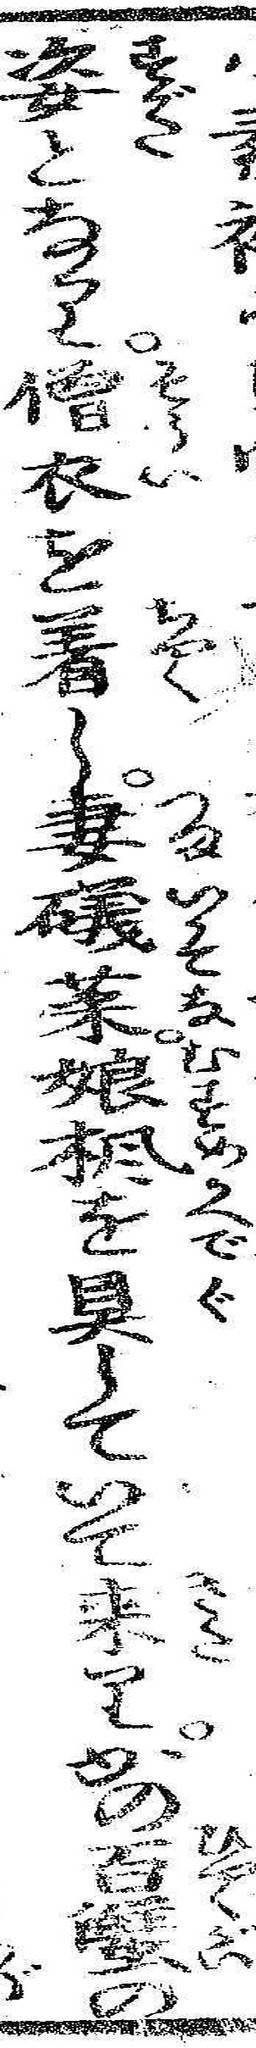姿となり。僧衣を着し。妻礒菜。娘楓を具していて来り。かの百蟹の
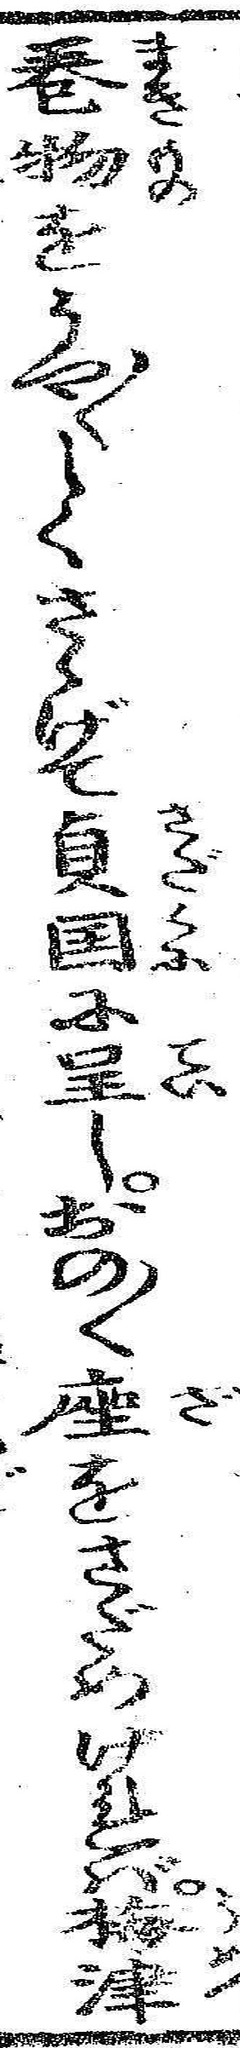巻物をうや〳〵しくさゝげて貞国に呈し。おの〳〵座をさだめければ。梅津
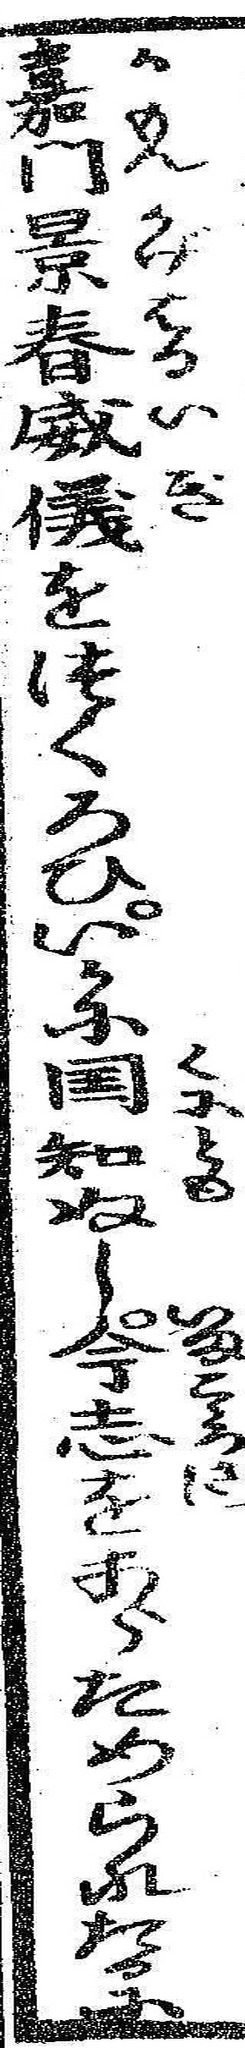嘉門景春威儀をつくろひ。いかに国知ぬし。今志をあらためられたるに
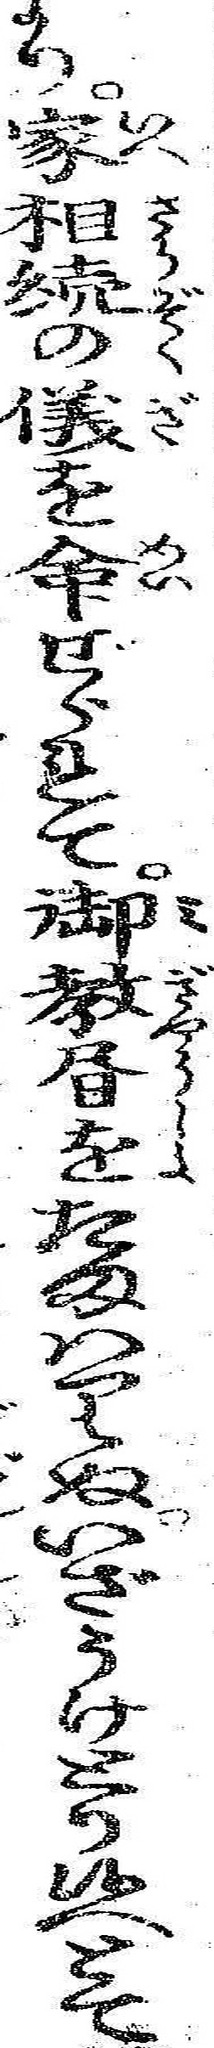より。家相続の儀を命ぜられて。御教書をたまはりぬ。いざうけとり候へとて
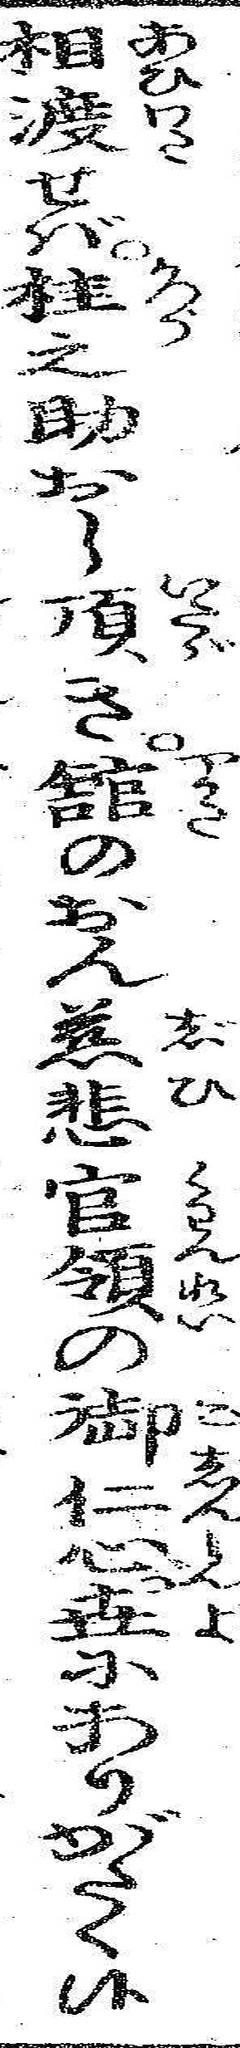相渡せば。桂之助おし頂き。館のおん慈悲官領の御仁心世にありがたく候
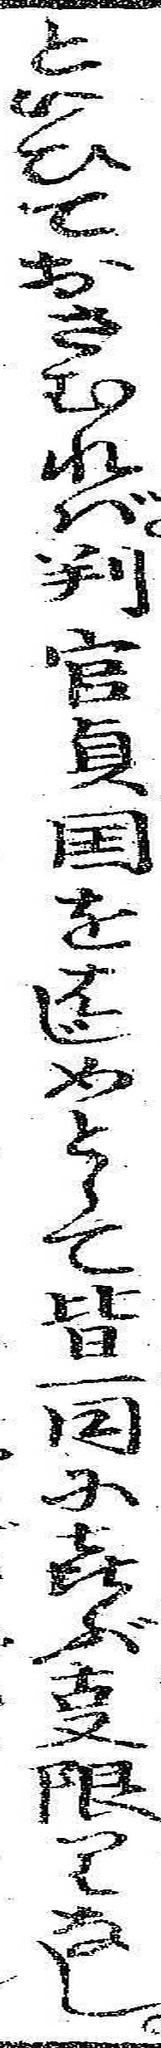といひておさむれば。判官貞国をはじめとして皆一同に㐂ぶ事限りなし。
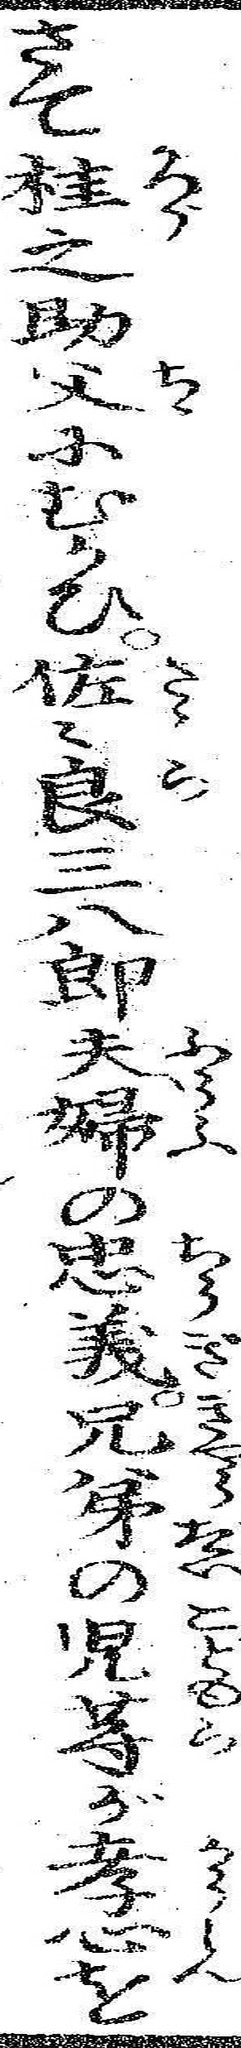さて桂之助父にむかひ。佐々良三八郎夫婦の忠義。兄弟の児等が孝心を
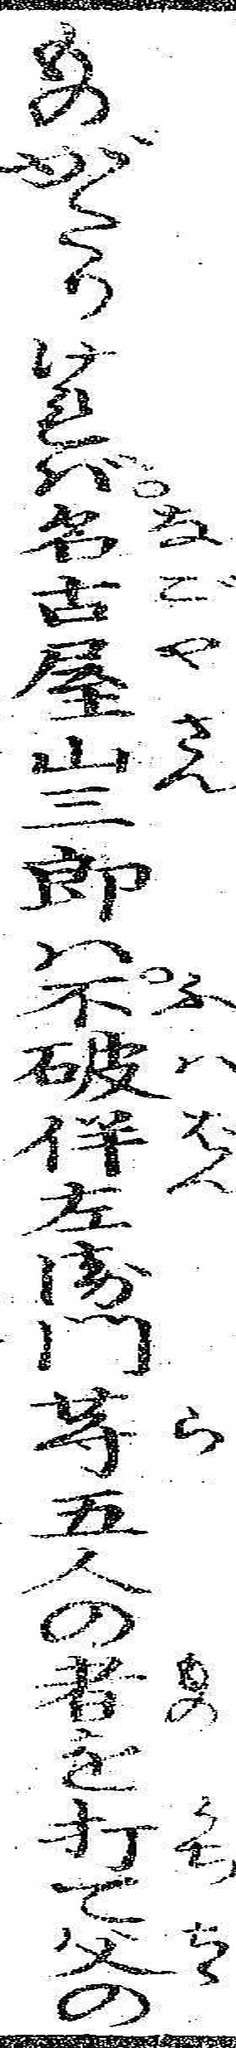ものがたりければ。名古屋山三郎は。不破伴左衛門等五人の者を打て父の
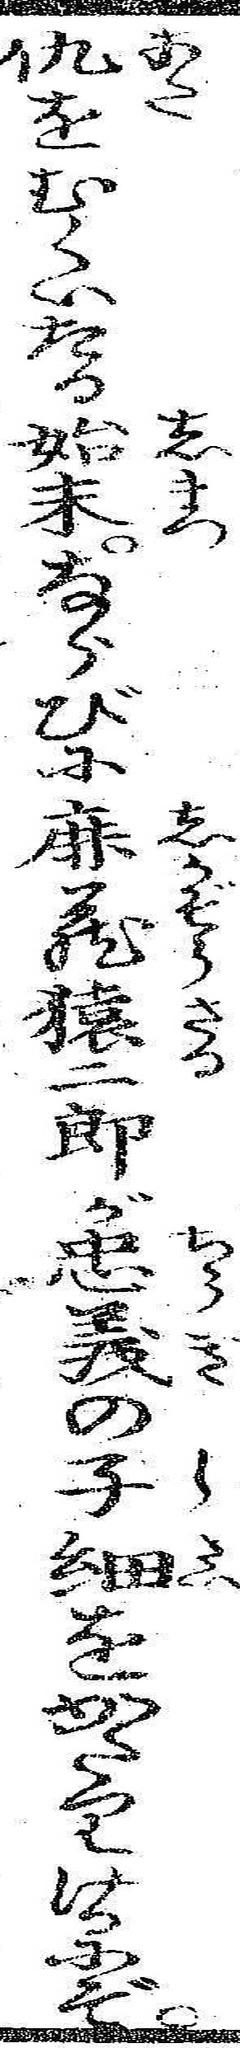仇をむくいたる始末。ならびに鹿蔵猿二郎が忠義の子細をかたりけるにぞ。
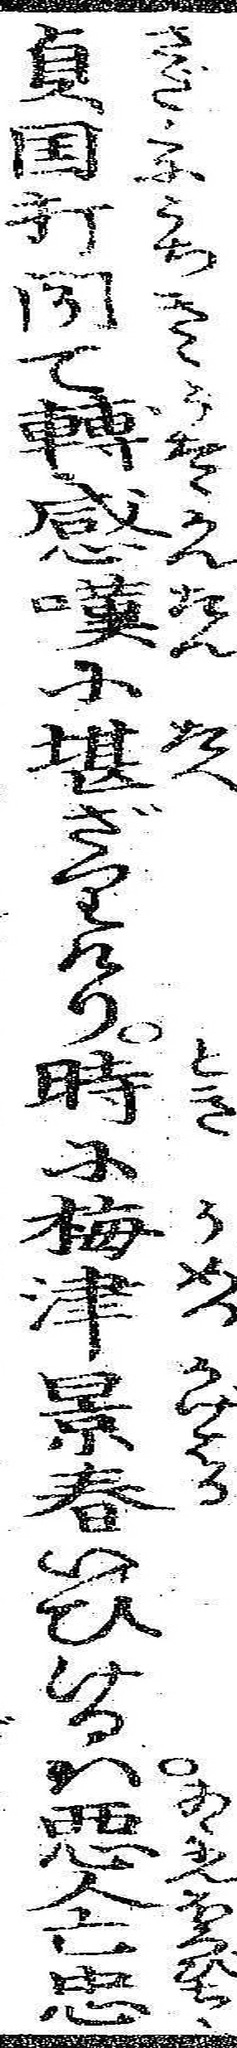貞国打聞て転感嘆に堪ざりけり。時に梅津景春いひけるは。悪人亡忠
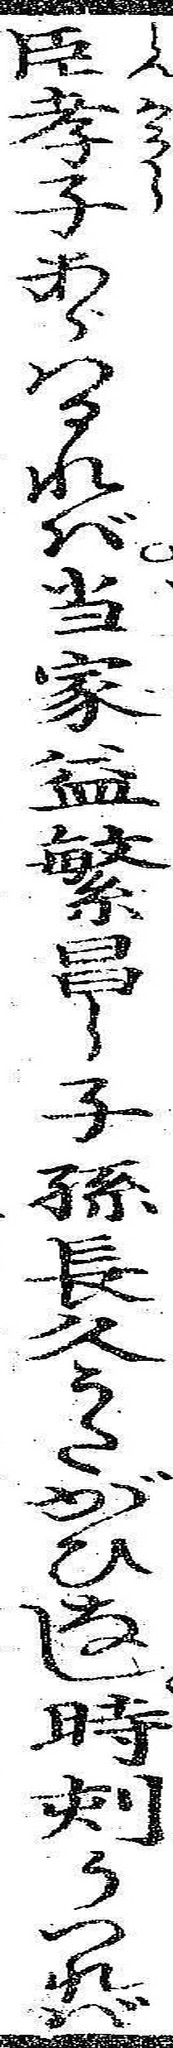臣孝子あらはるれば。当家益繁昌し子孫長久うたがひなし。時刻うつれば
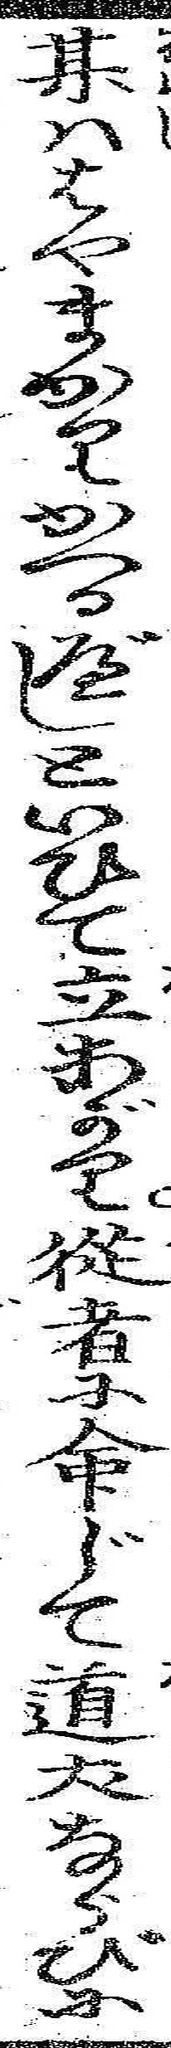某ははやまかりかへるべしといひて立あがり。従者に命じて道犬ならびに
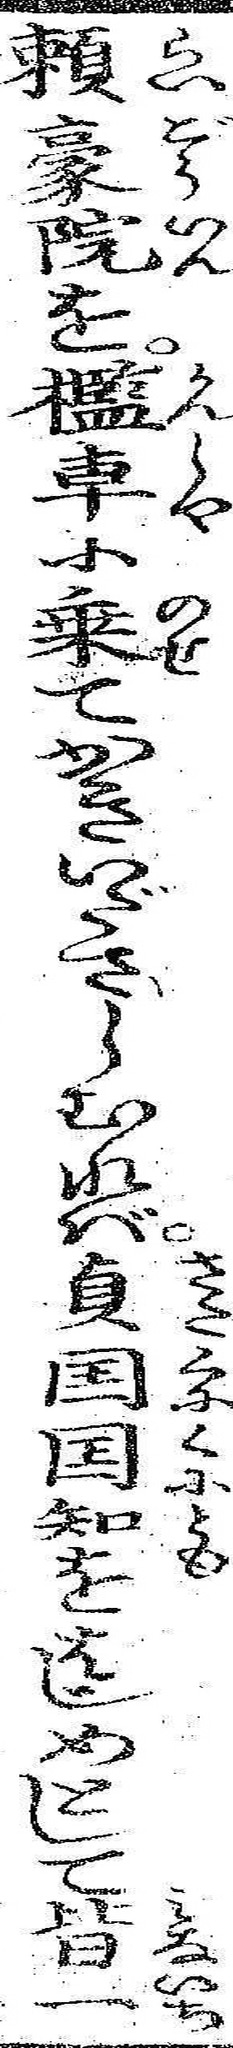頼豪院を。檻車に乗てかきいださしむれば。貞国国知をはじめとして皆一
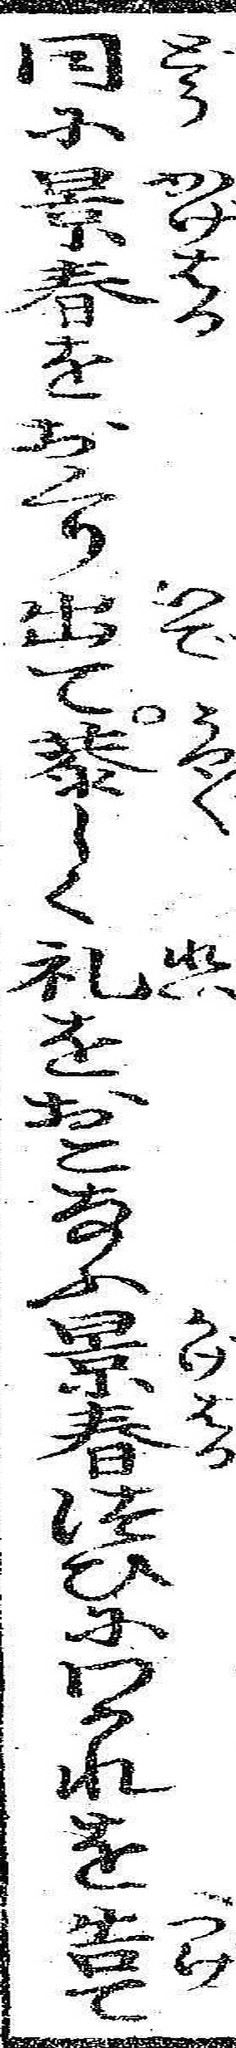同に景春をおくり出て。恭しく礼をおこなふ景春つひにわかれを告て

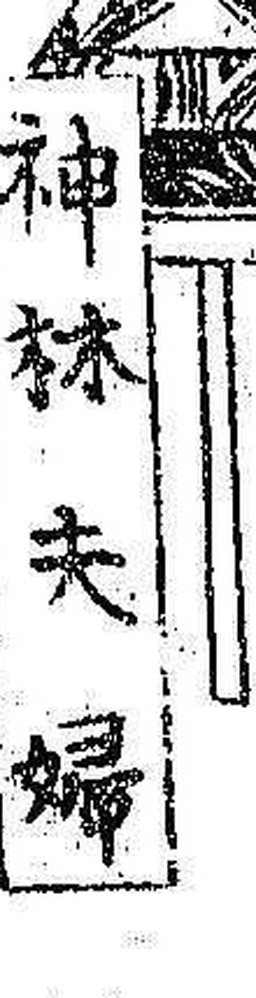神林夫婦
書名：昔話稲妻表紙
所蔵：国文学研究資料館
